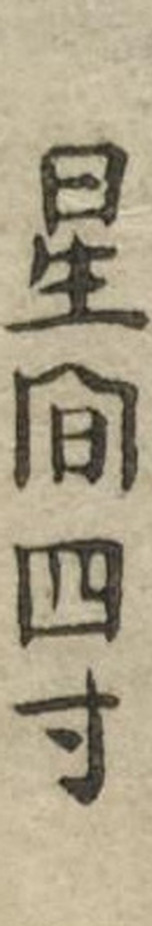星間四寸
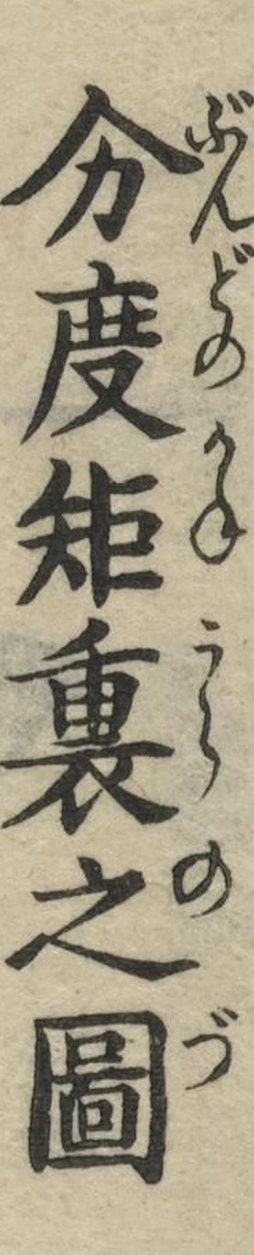分度矩裏之図
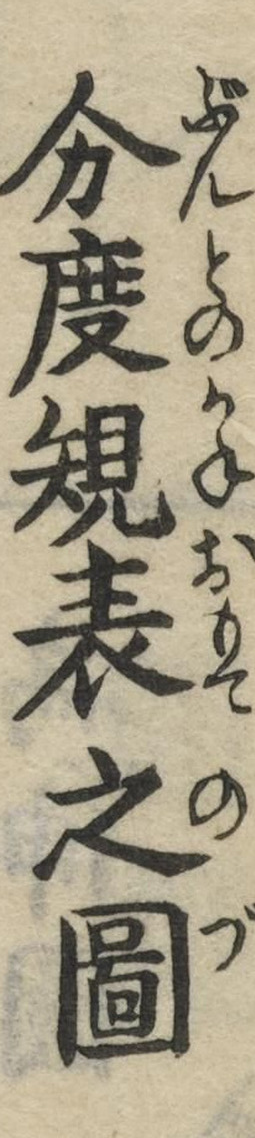分度規表之図
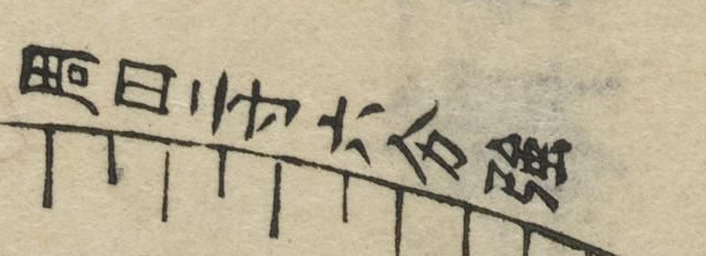周円ニ寸六分強
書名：量地指南　巻之一（内題）
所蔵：東京大学地震研究所図書室 Earthquake Research Institute Library, The University of Tokyo, JAPAN
